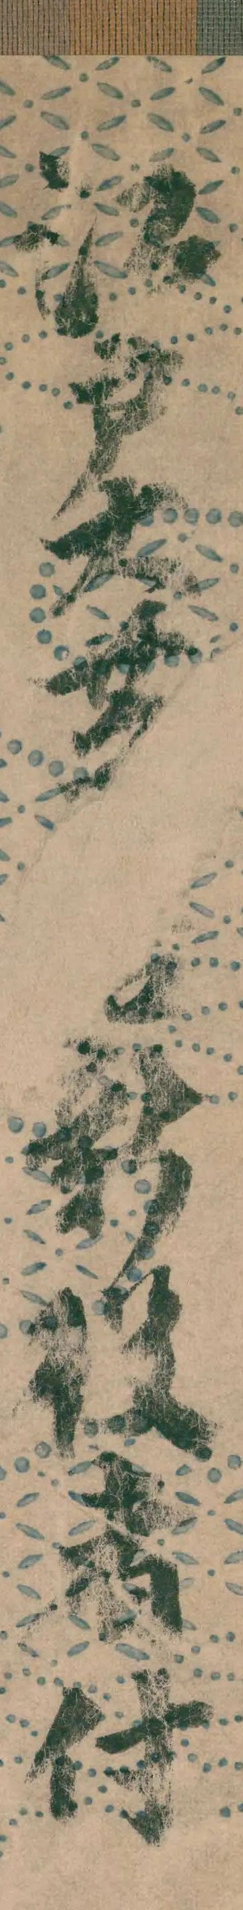江戸大新役者付

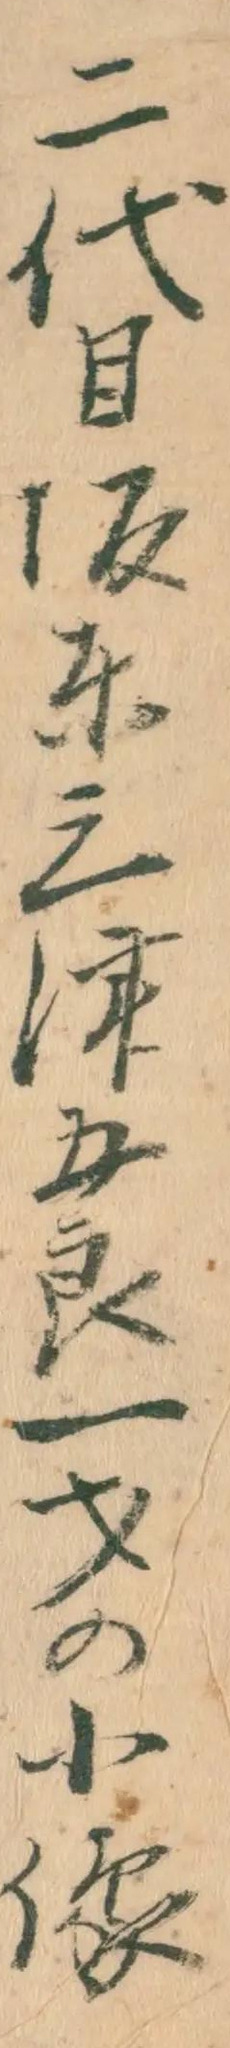二代目坂東三津五郎一才の小像
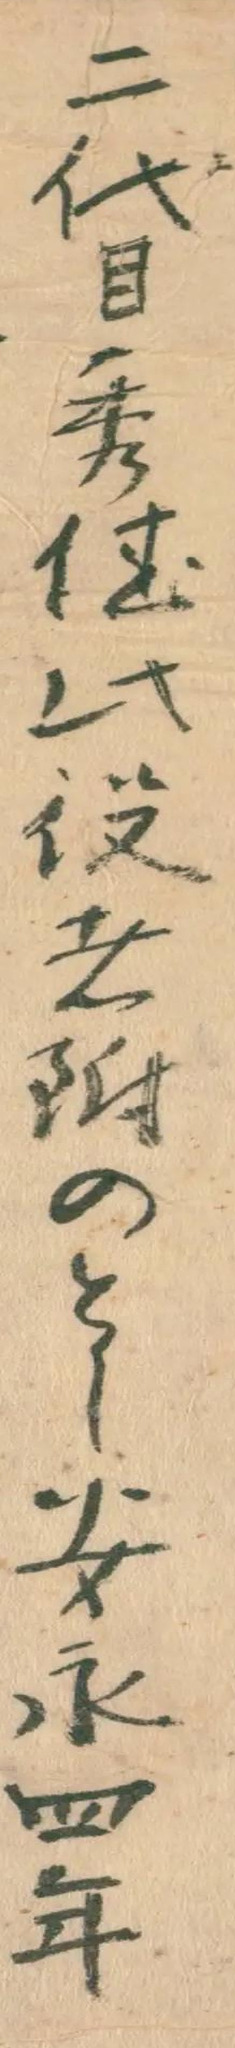二代目秀佳此役者附のとし安永四年
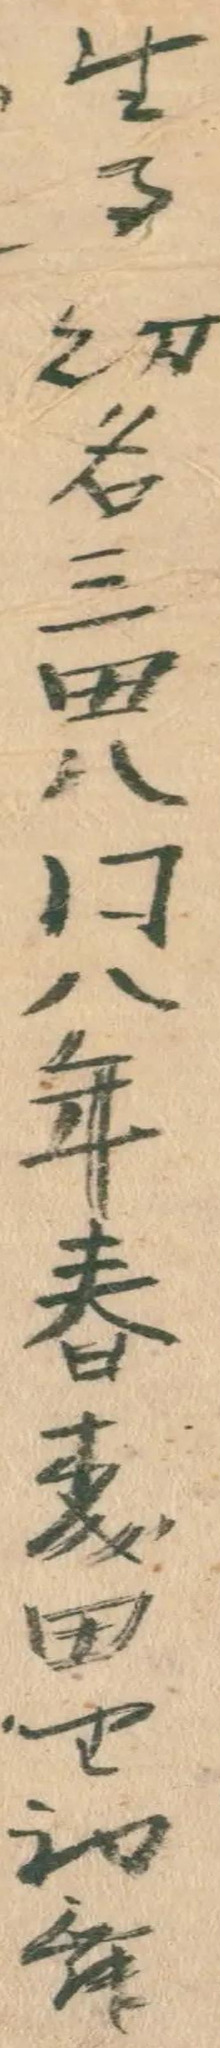生る幼名三田八同八年春森田座初舞
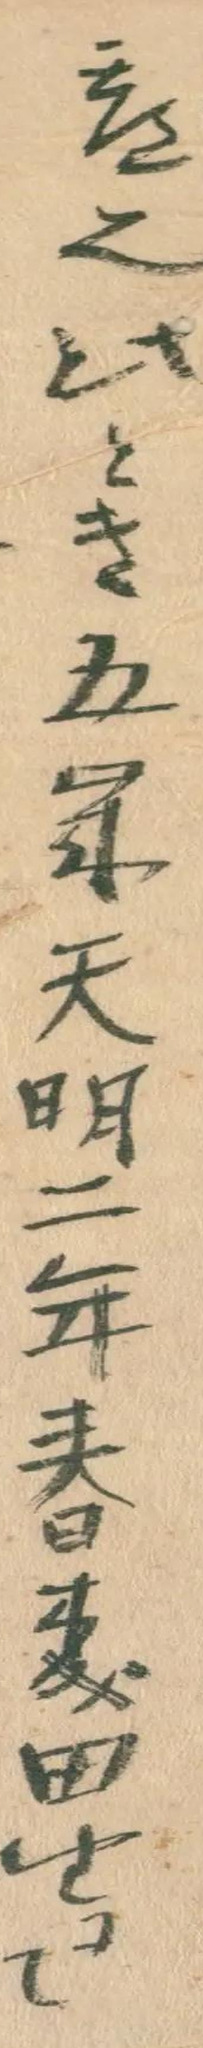台也此とき五歳天明二年春森田座にて
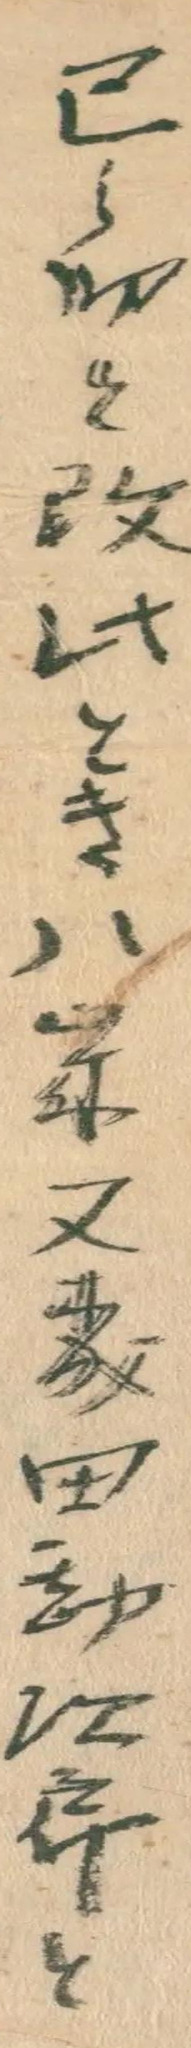巳之助と改此とき八歳又森田勘次郎と
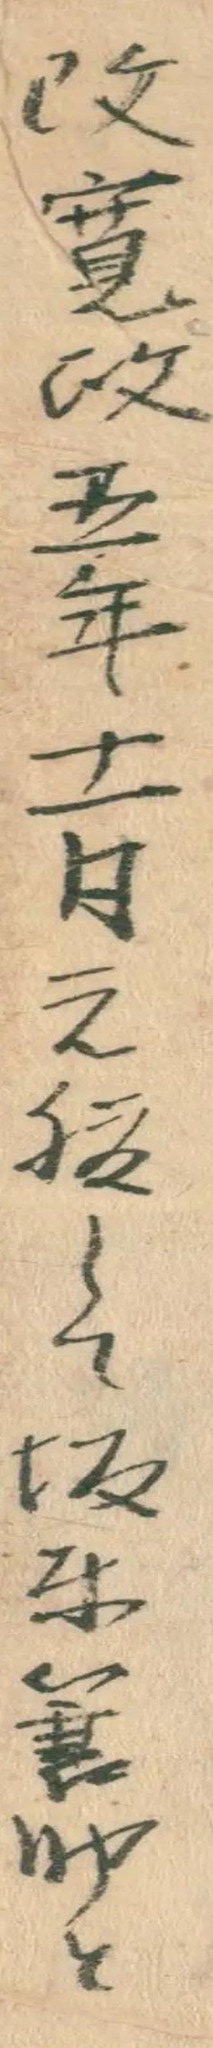改寛政五年十一月元服して坂東簑助と
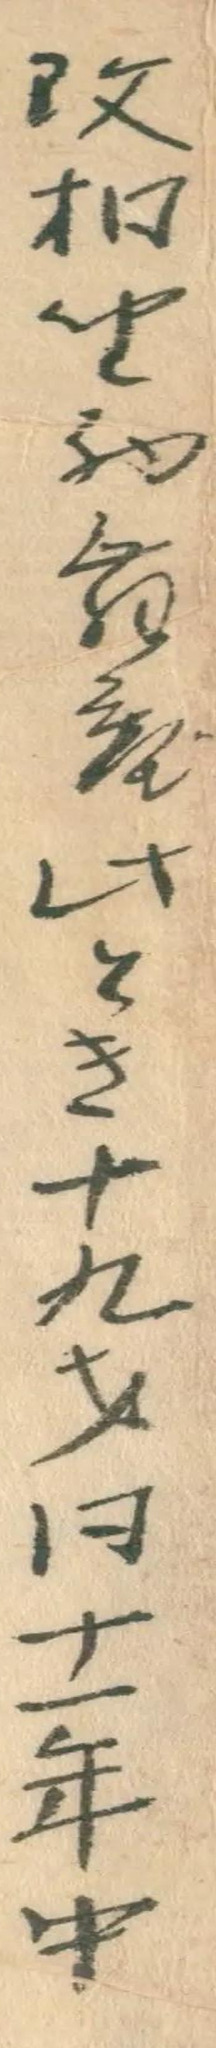改桐座初舞台此とき十九才同十一年中
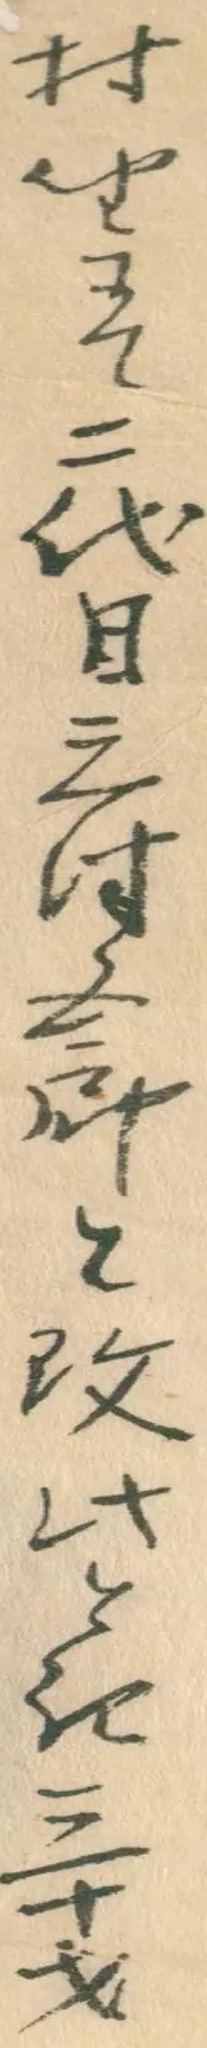村座にて二代目三津五郎と改此とき三十才
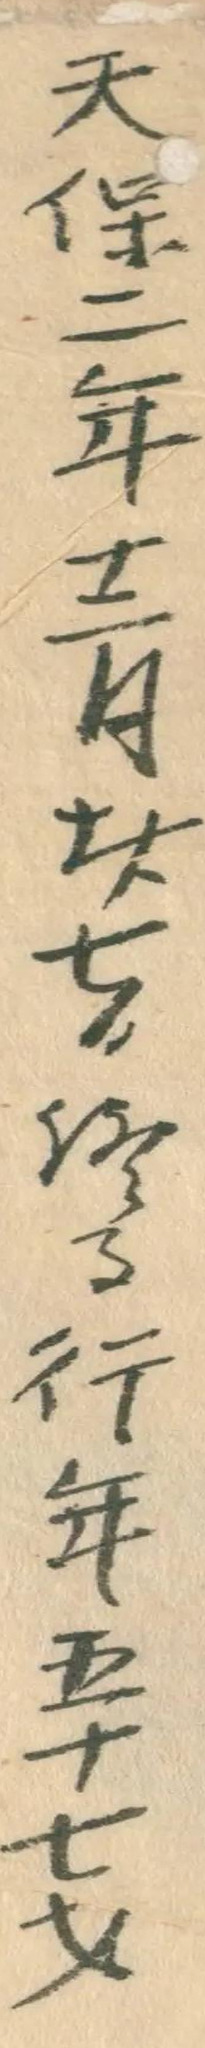天保二年十二月十二月廿七日終る行年五十七才
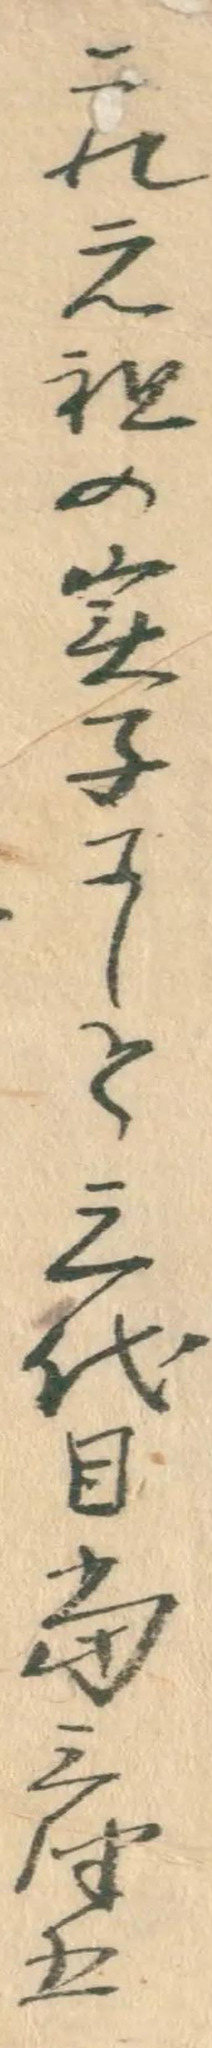これ元祖の実子にして三代目当三津五
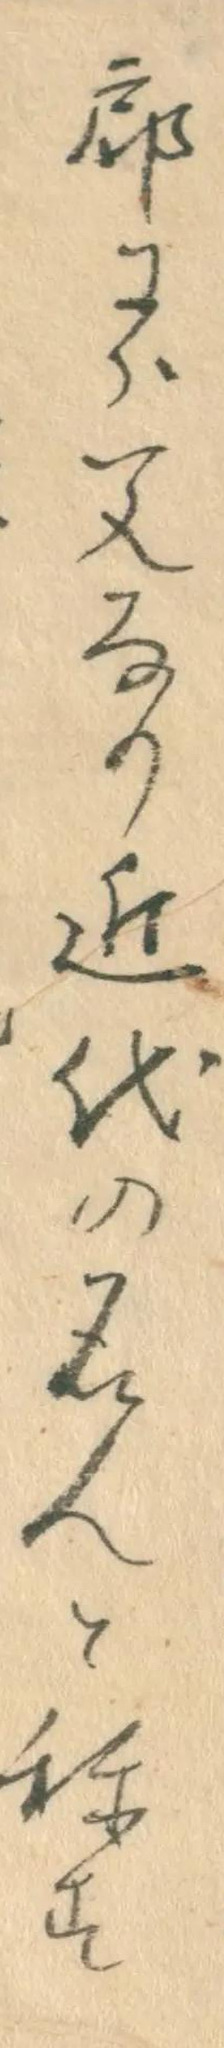郎には父なり近代の名人と称す
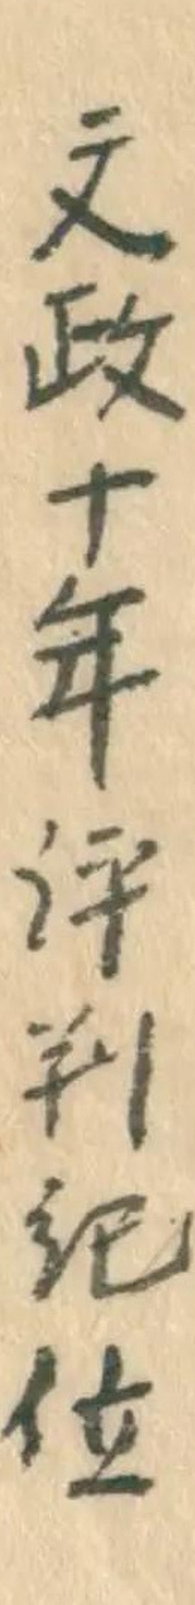文政十年評判記位
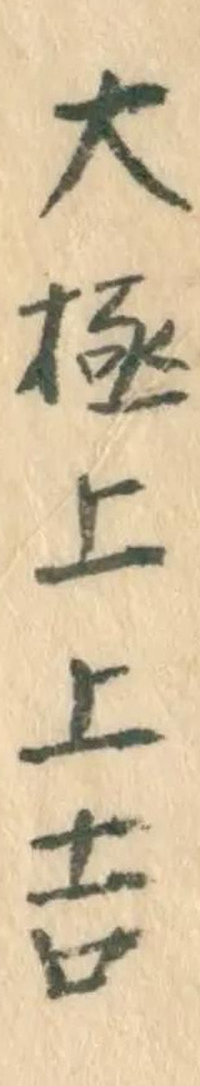大極上上吉
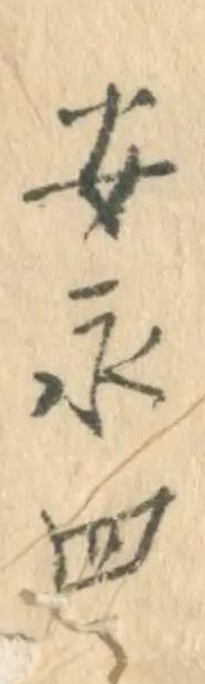安永四

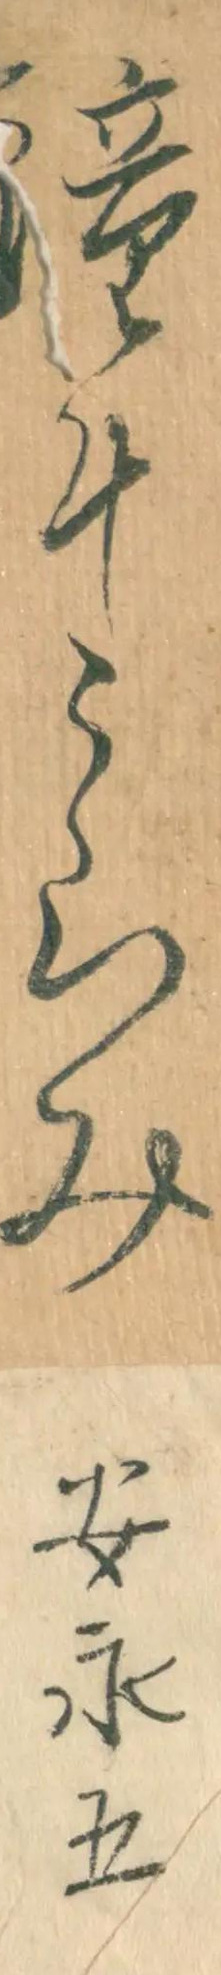鐘とうらみ安永五
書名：江戸大芝居新役者附
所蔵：国立国会図書館 National Diet Library, JAPAN
